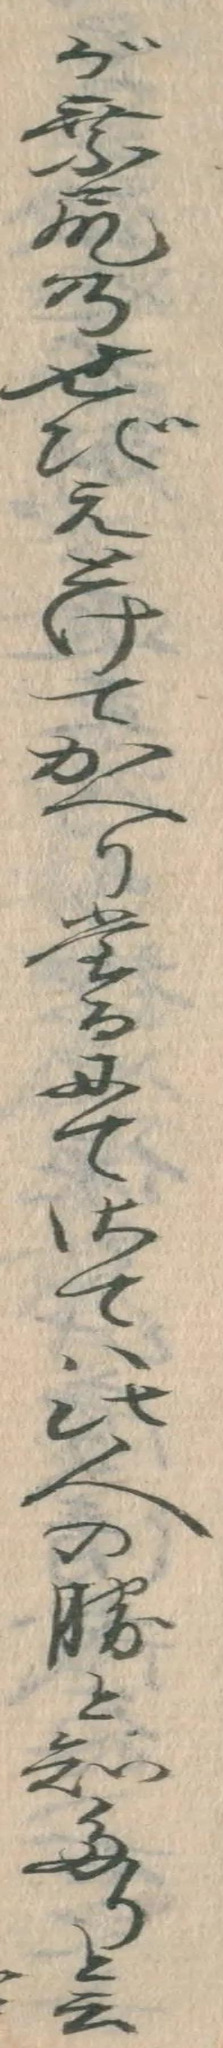が乗尻のせびえとけてかへりたるにてさては此人の勝と知たりと云
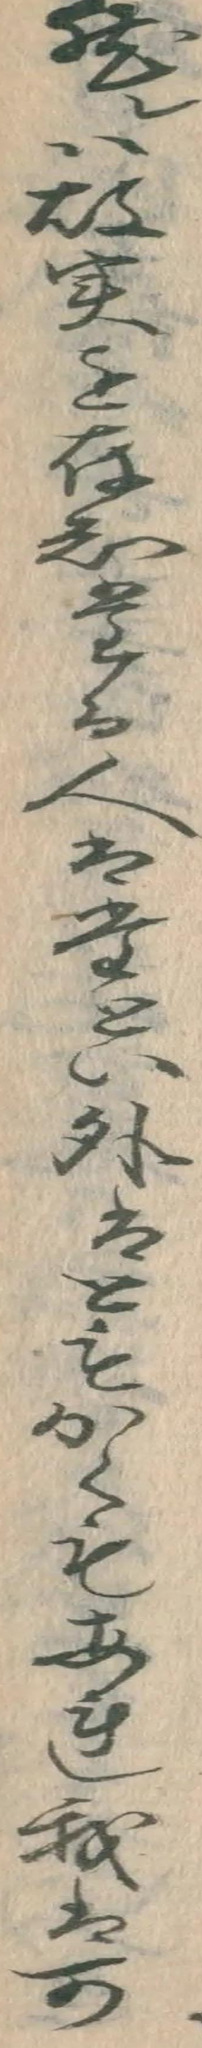然レハ故実を存知たる人はたとい外はともかくもあれ我は可

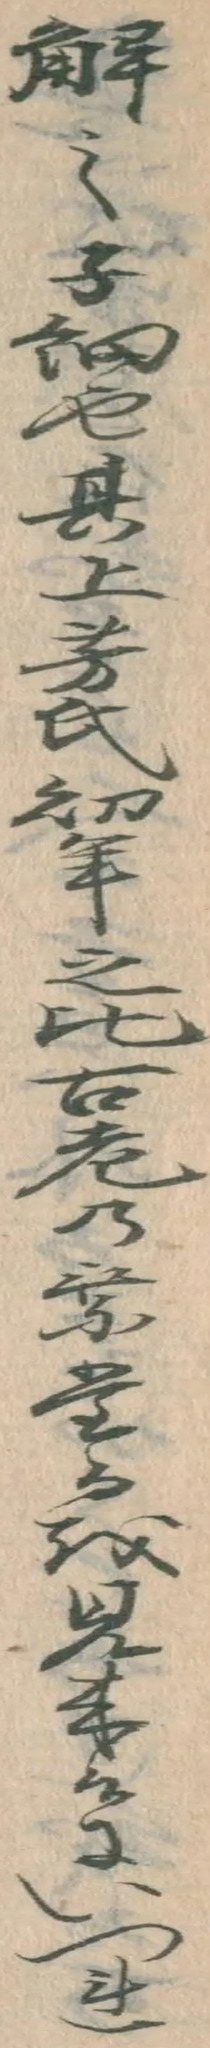解之子細也其上芳氏幼年之比古老の乗たるを見来候にいつれ
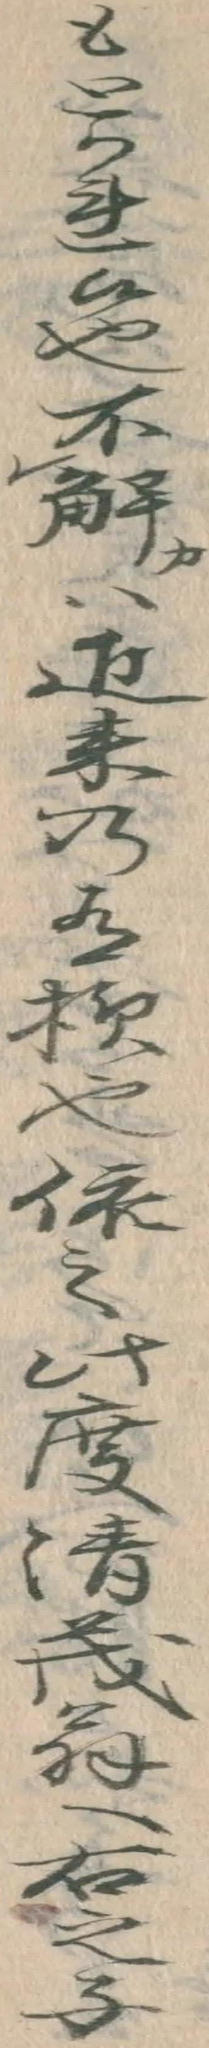もとかれ候也不解ハ近来の有様也依之此度清茂翁へ右之子
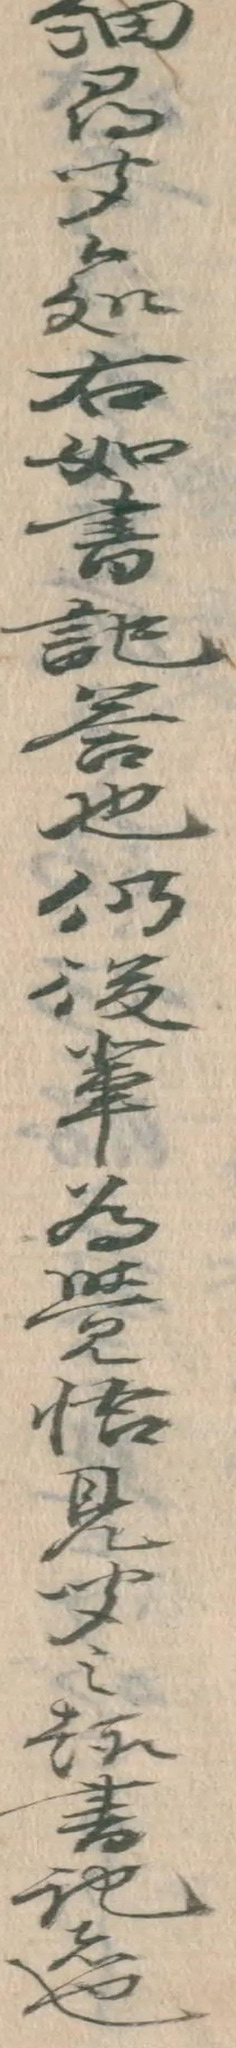細尋聞候処右如書記答也仍後輩為覚悟見聞之趣書記者也
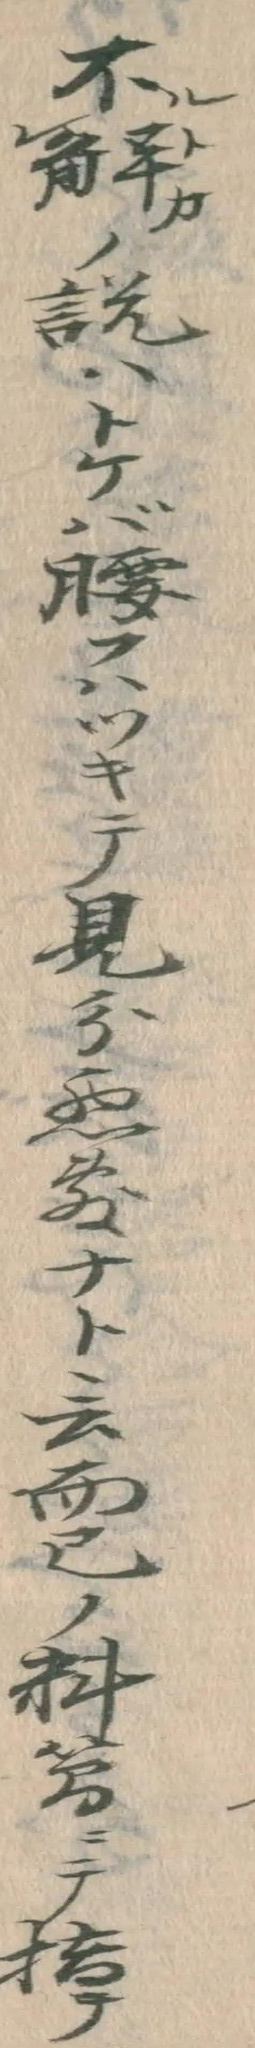不解ノ説ハトケバ腰フハツキテ見分悪敷ナト云而已ノ科簡ニテ指テ
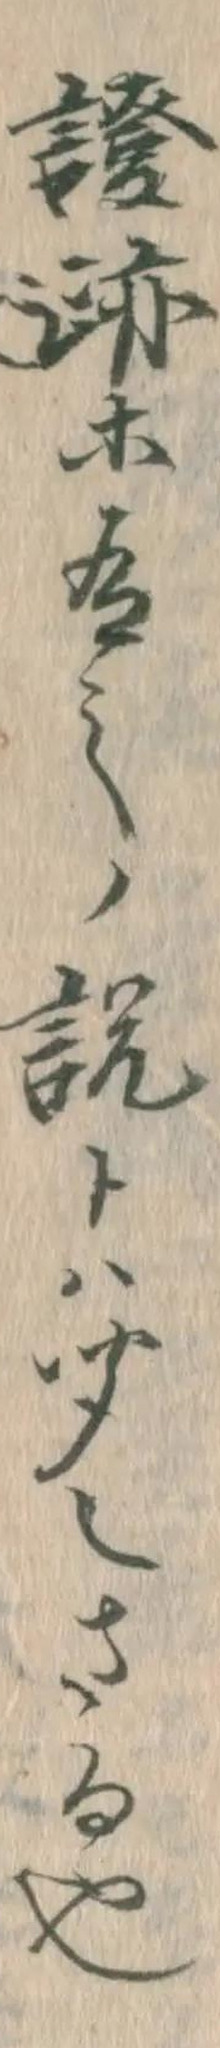証跡等有之ノ説トハ聞之さる也
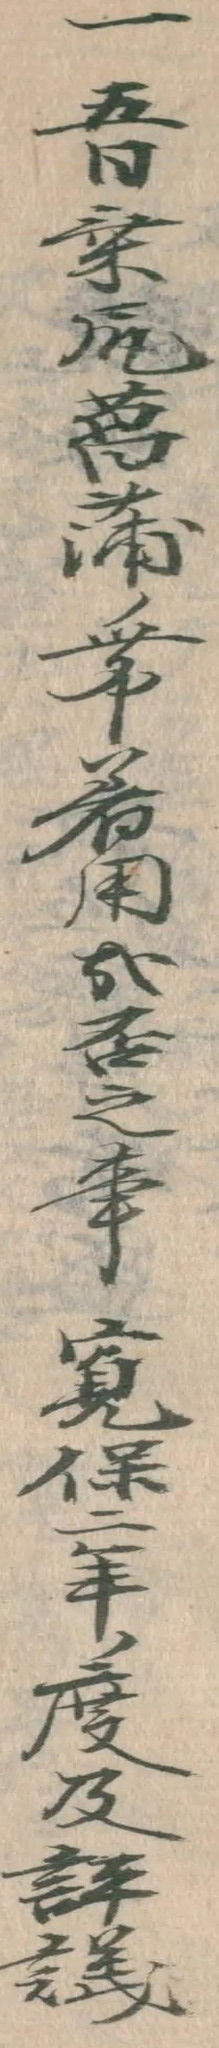一五日乗尻菖蒲ノ帯着用哉否之事寛保二年ノ度及評議
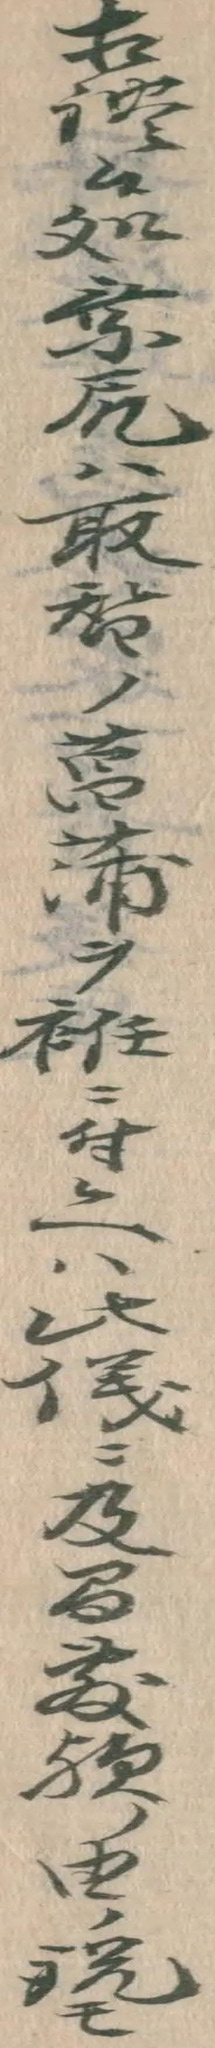相談候処乗尻ハ取替ノ菖蒲ヲ袵ニ付候へハ此儀ニ及間敷歟ノ由ノ説モ
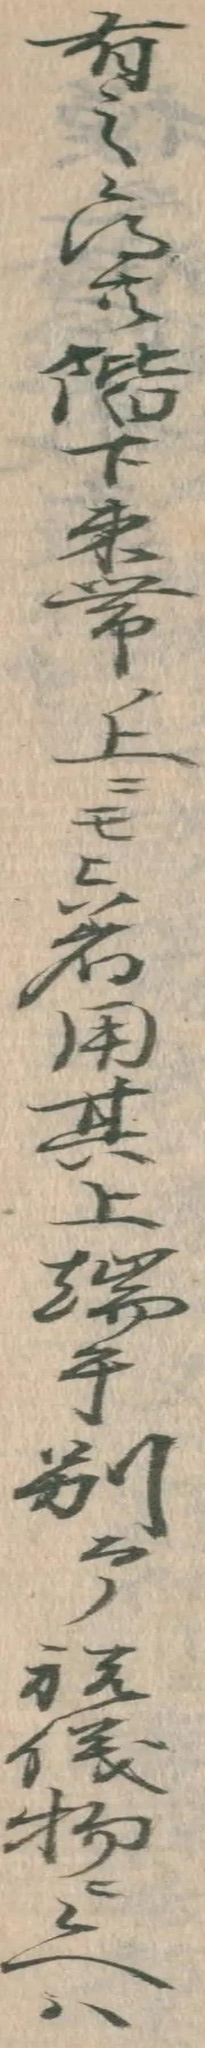有之候得共階下束帯ノ上ニモ被着用其上端午別而ノ祝儀物ニ候へハ
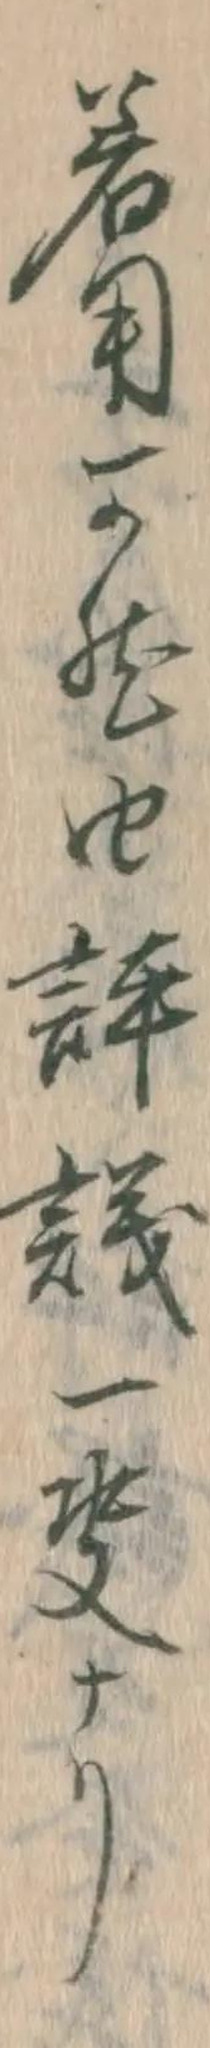着用可然由評議一決ナリ
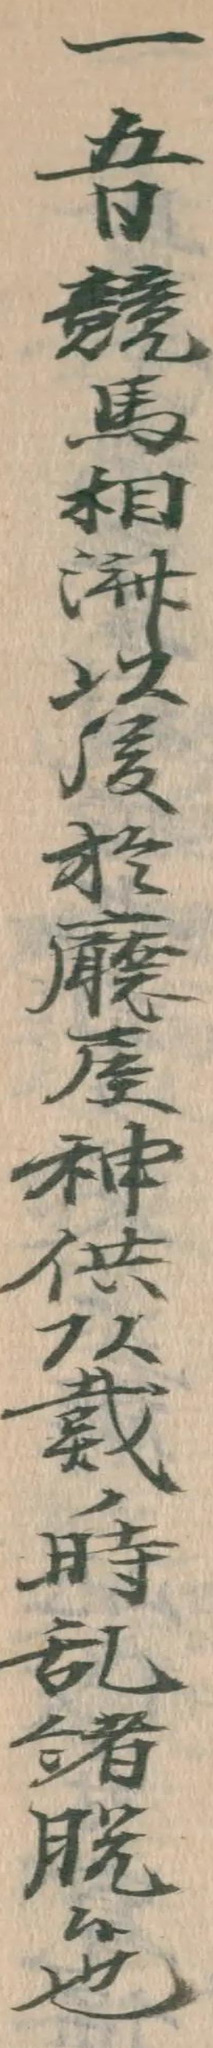一五日競馬相済以後於庁屋神供頂戴ノ時乱緒脱候也
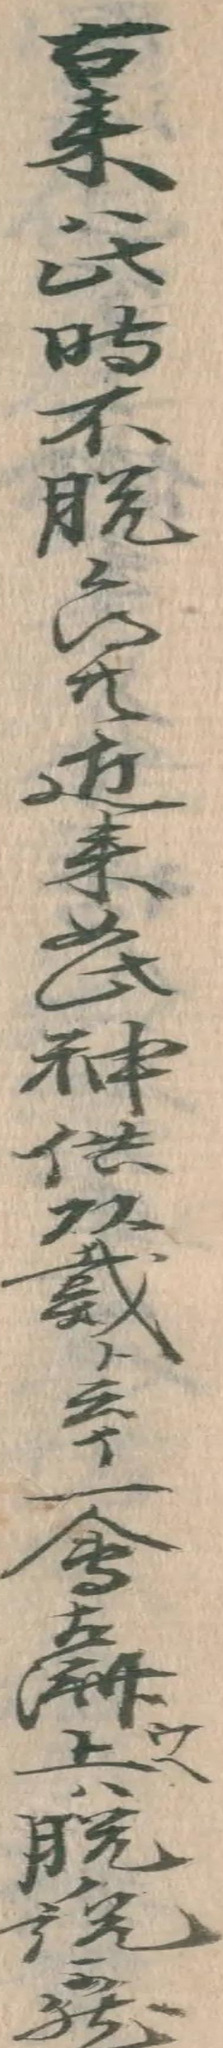古来ハ此時不脱候得共近来如此神供頂戴ト卒一会相済上ハ脱ノ説可然
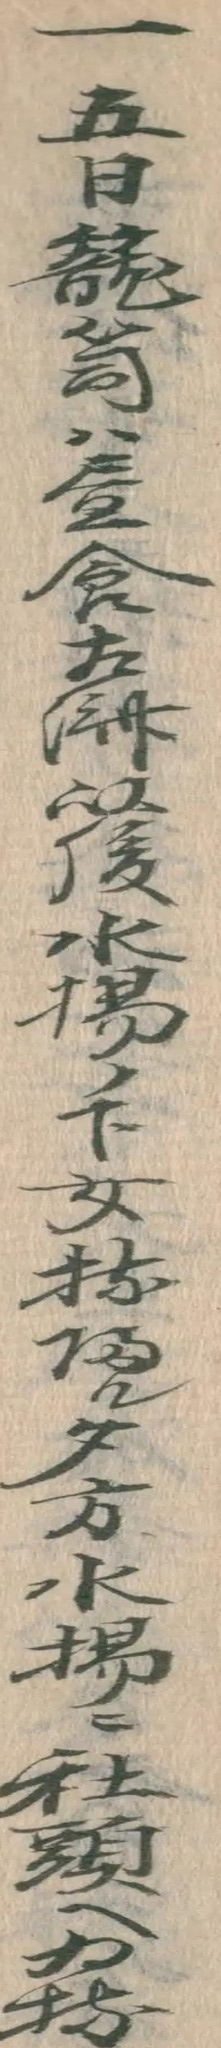一五日籠笥ハ昼食相済以後水揚ノ下女持帰ル夕方水揚ニ社頭へ為持
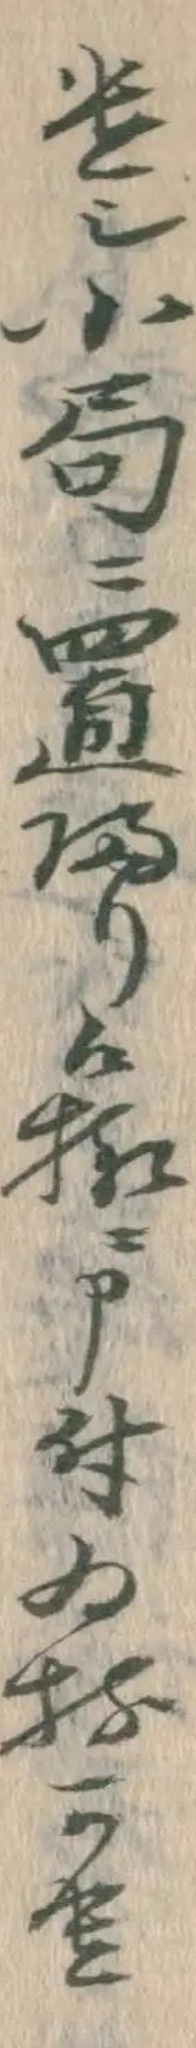遣シ小局ニ置帰リ候様ニ申付為持可遣
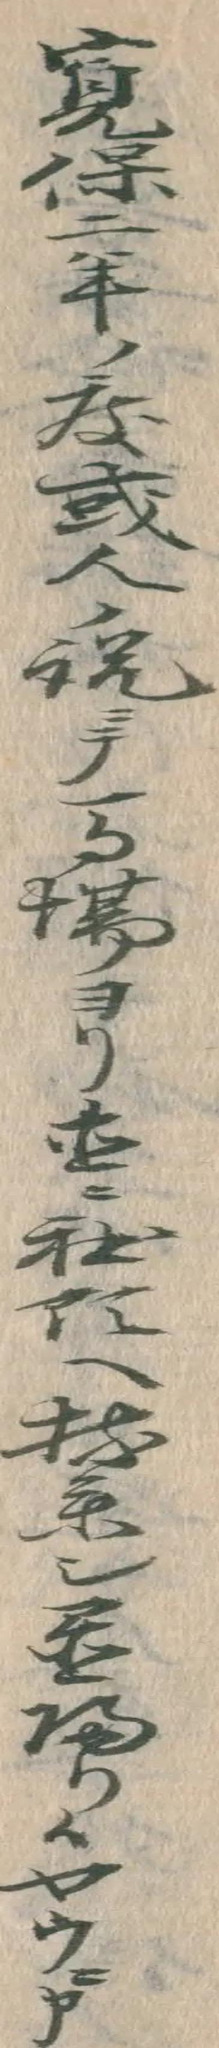寛保二年ノ度或人ノ説ニテ馬場ヨリ直ニ社頭へ持参シ置帰リ候ヤウニ申
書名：賀茂社記録. 第11冊
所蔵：国立国会図書館 National Diet Library, JAPAN
